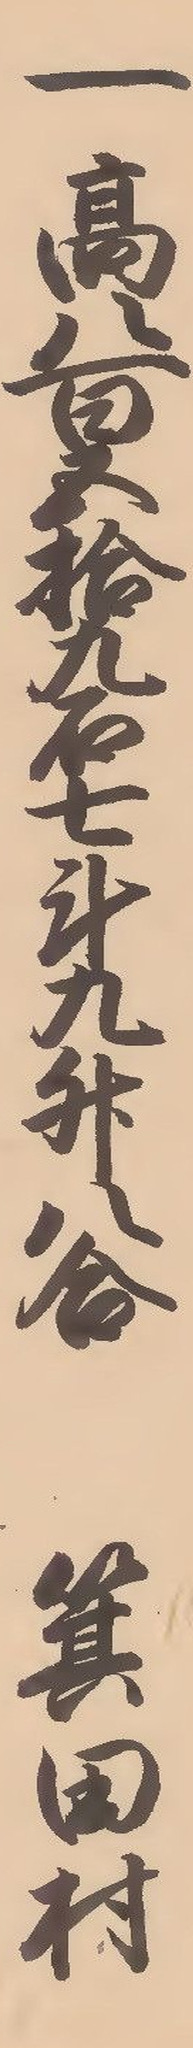一髙八百五拾九石七斗九升八合箕田村
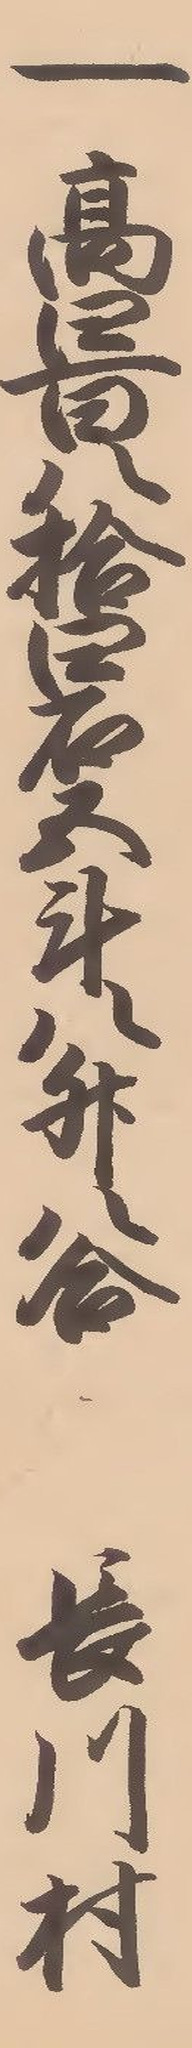一髙四百八拾四石五斗八升八合長川村
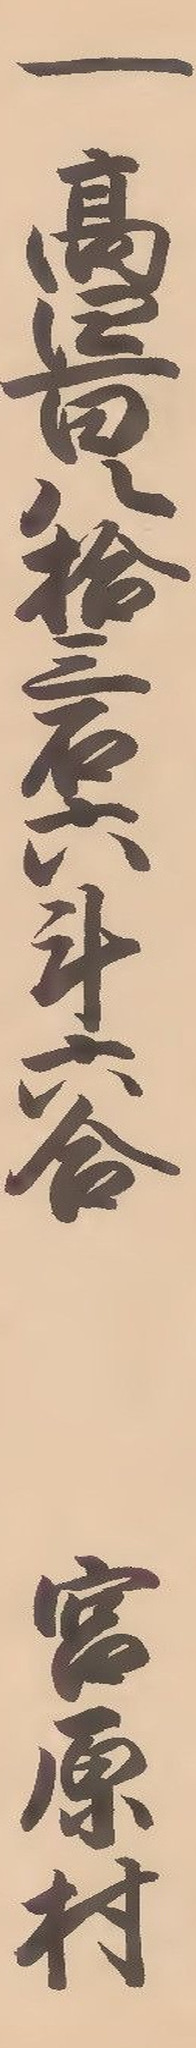一髙四百八拾三石六斗六合宮原村
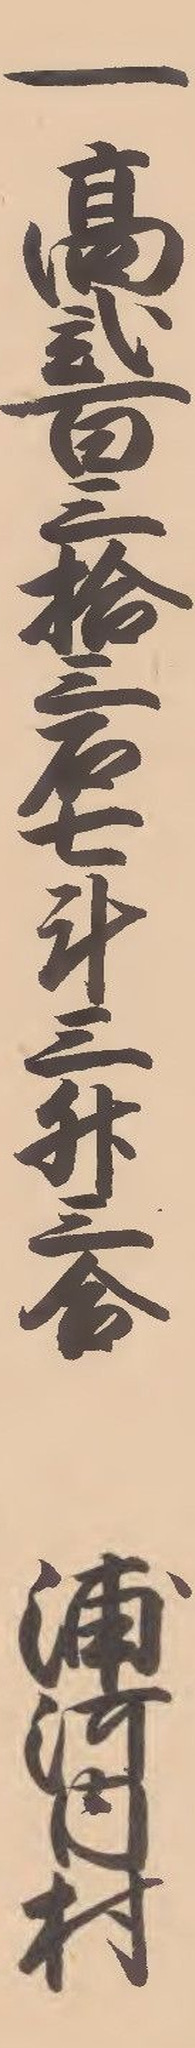一髙弐百三拾三石七斗三升三合浦河内村
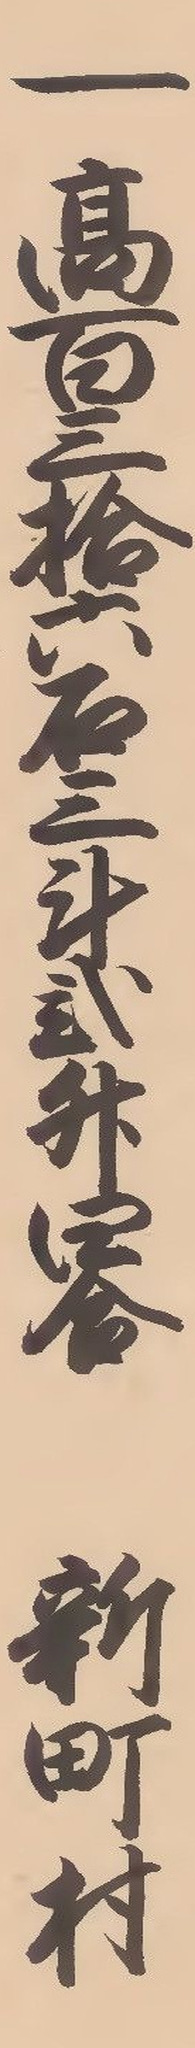一髙百三拾六石三斗弐升四合新町村
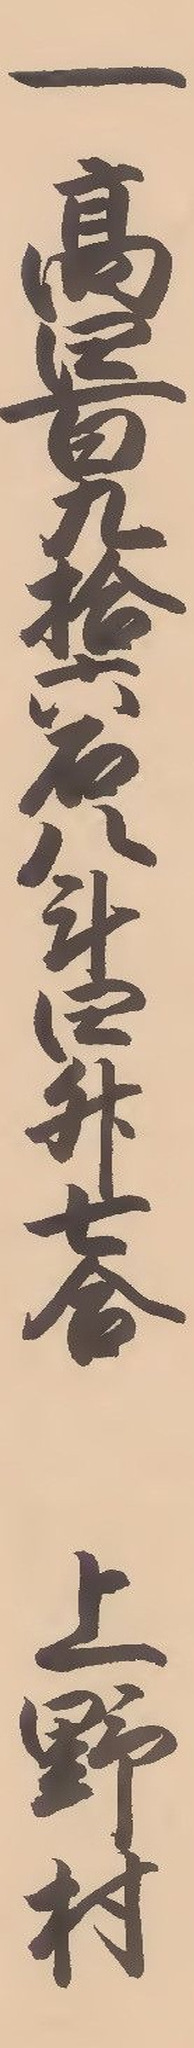一髙四百九拾六石八斗四升七合上野村
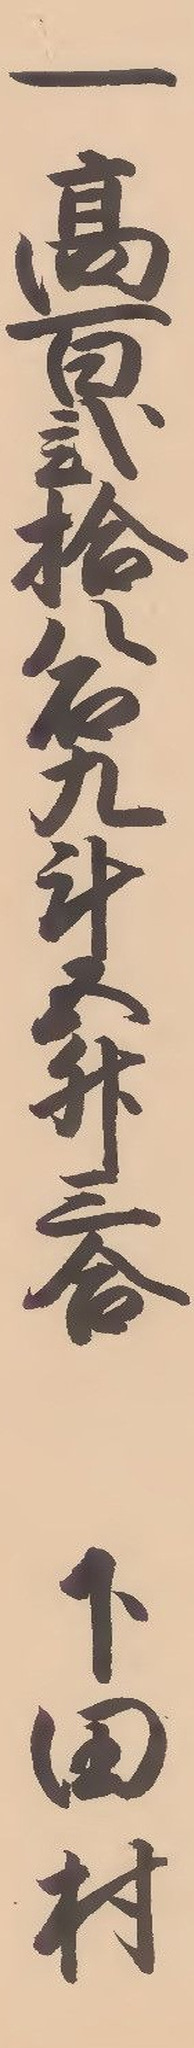一髙百弐拾八石九斗五升三合下田村

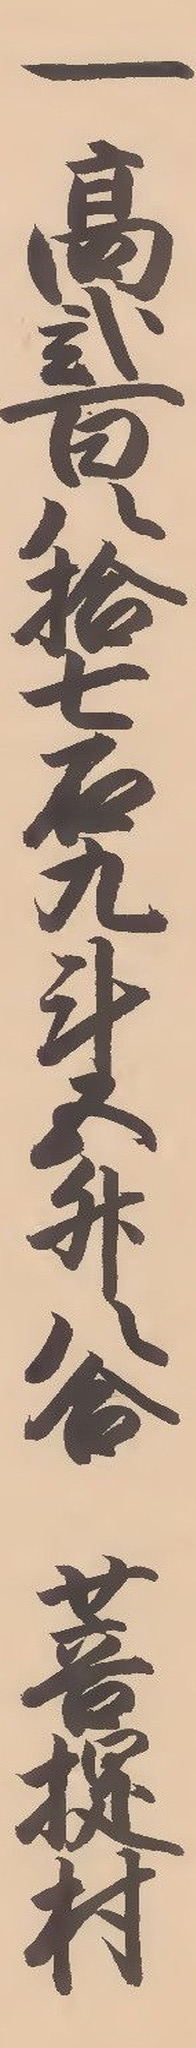一髙弐百八拾七石九斗五升八合菩提村
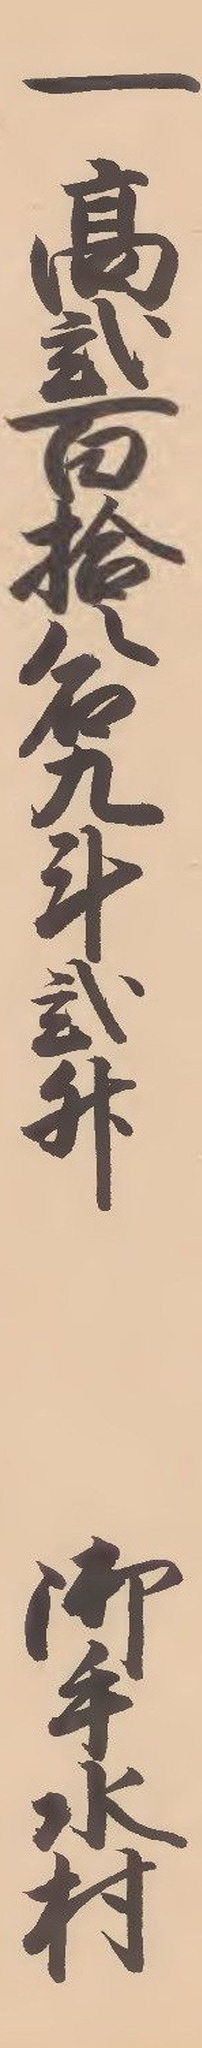一髙弐百拾八石九斗弐升御手水村
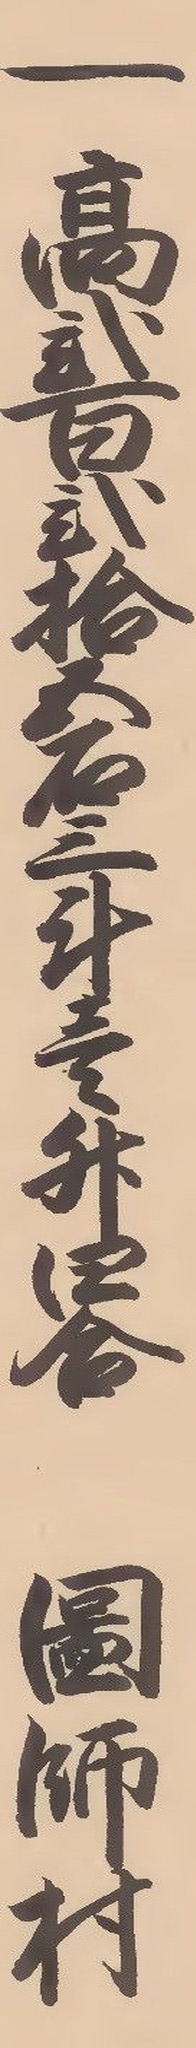一髙弐百弐拾五石三斗壱升四合圖師村
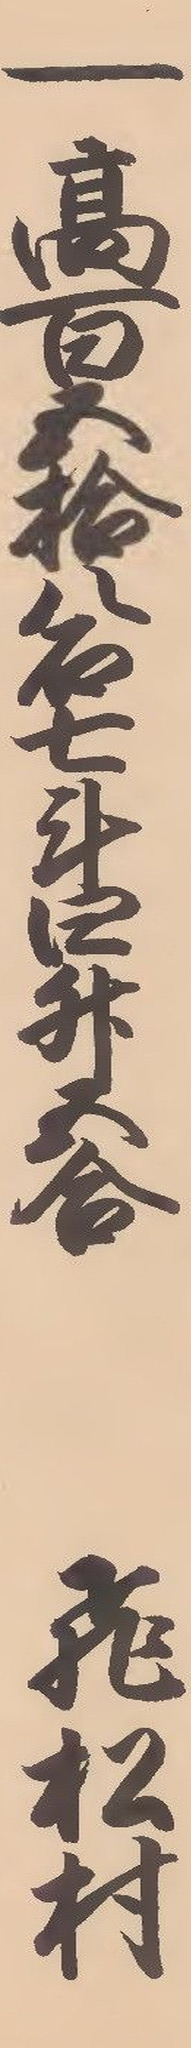一高百五拾八石七斗四升五合飛松村
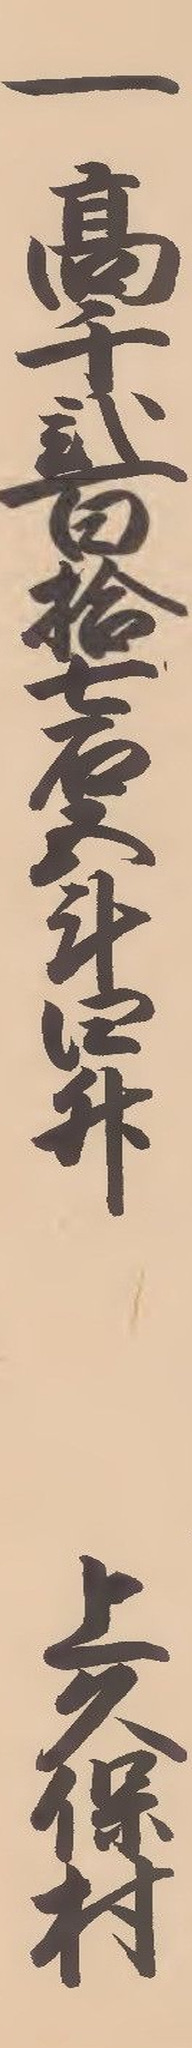一髙千弐百拾七石五斗四升上久保村
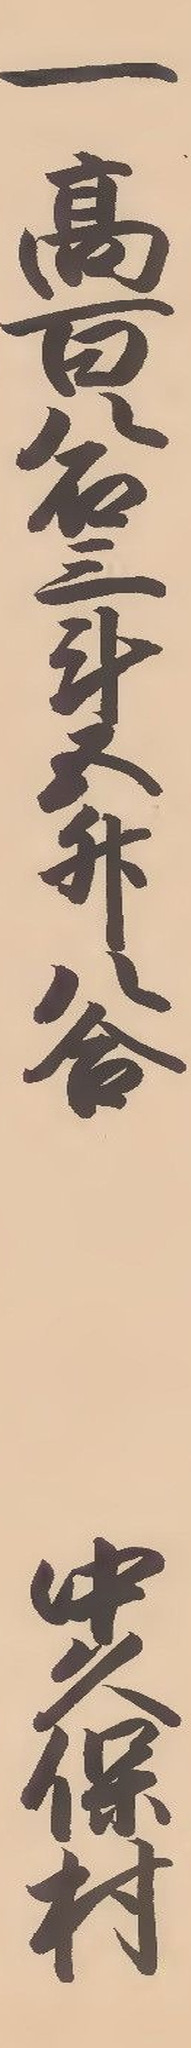一髙百八石三斗五升八合中久保村
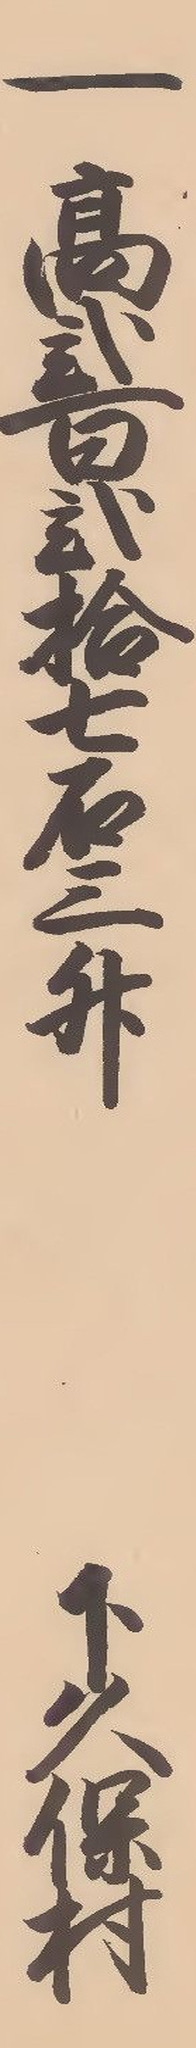一髙弐百弐拾七石三升下久保村
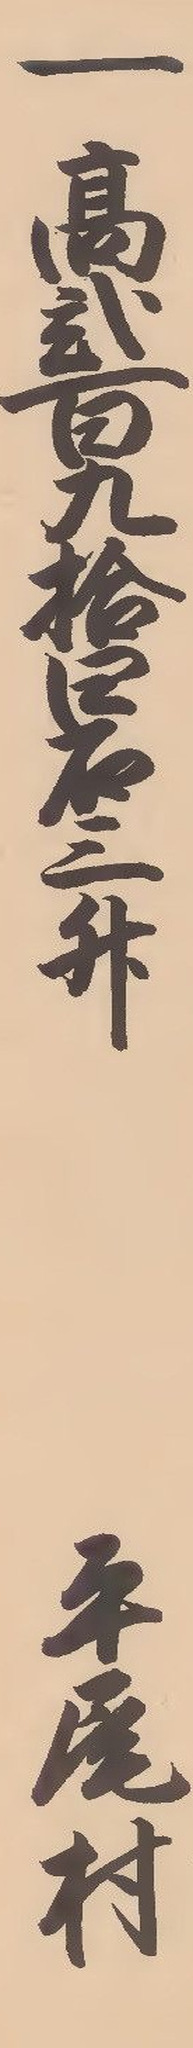一髙弐百九拾四石三升平尾村

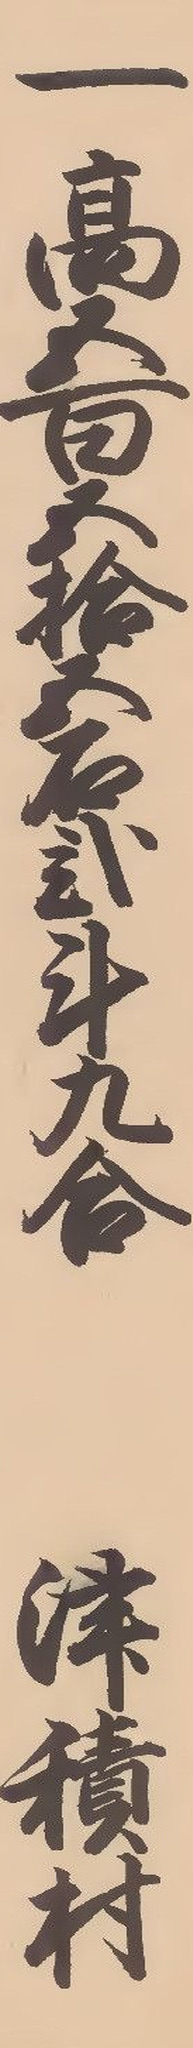一髙五百五拾五石弐斗九合津積村
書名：豊前国郷帳
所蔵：国立公文書館 National Archives of Japan
